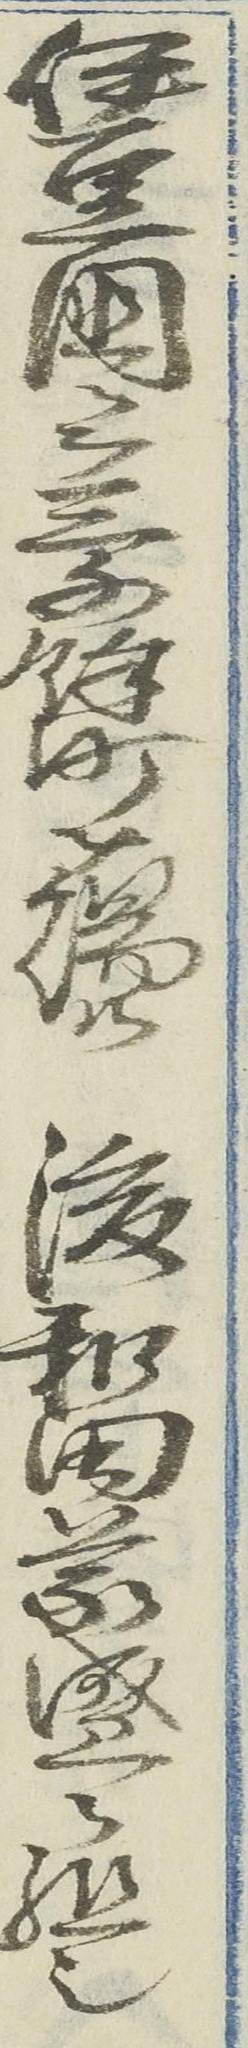伊豆国ニテ三千餘町ヲ賜ル後和田義盛ニ組シ
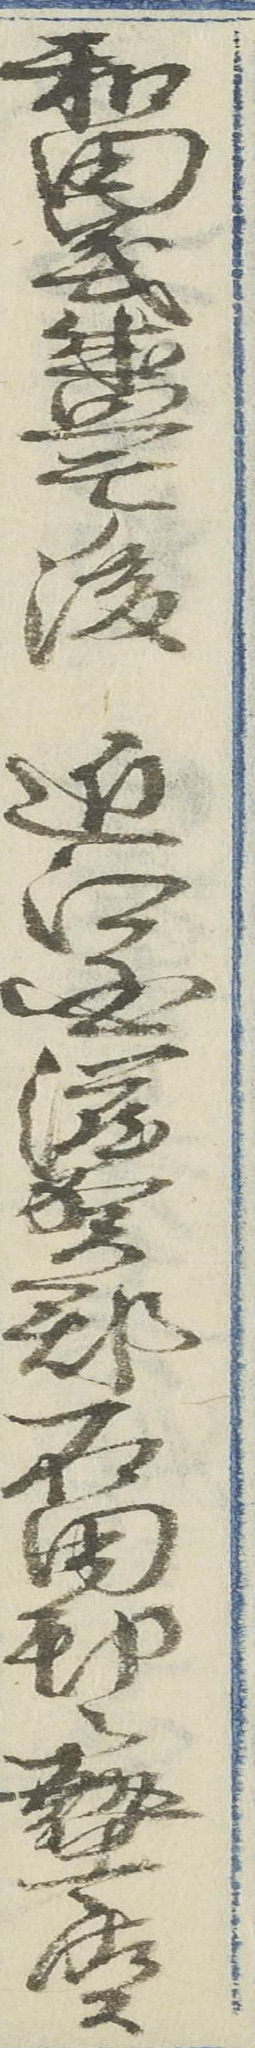和田義盛其後近江国滋賀郡石田邨二蟄居ス
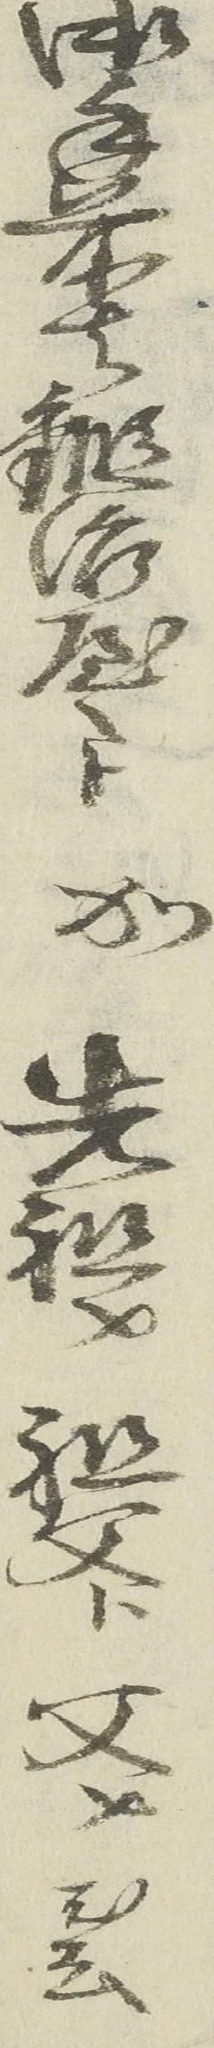御手前は鍛冶屋ノト加先祖ヲ祖父ト父ヲ云去

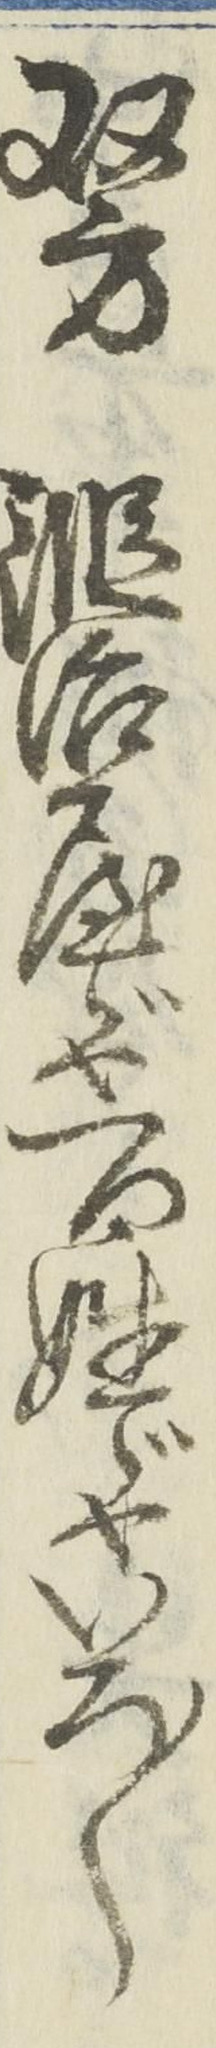双方鍛冶屋じゃ百姓じゃいろ〳〵
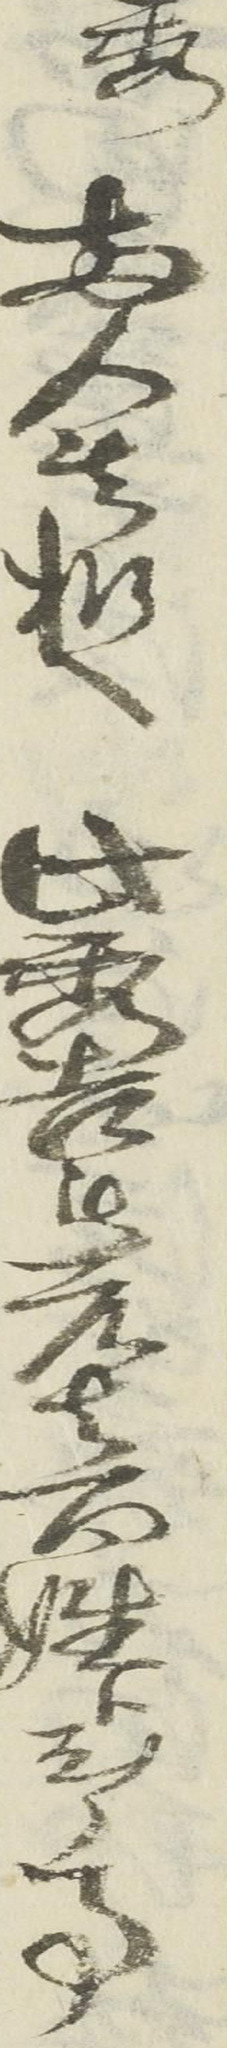秀両人共此秀吉も元は百姓ト云う事
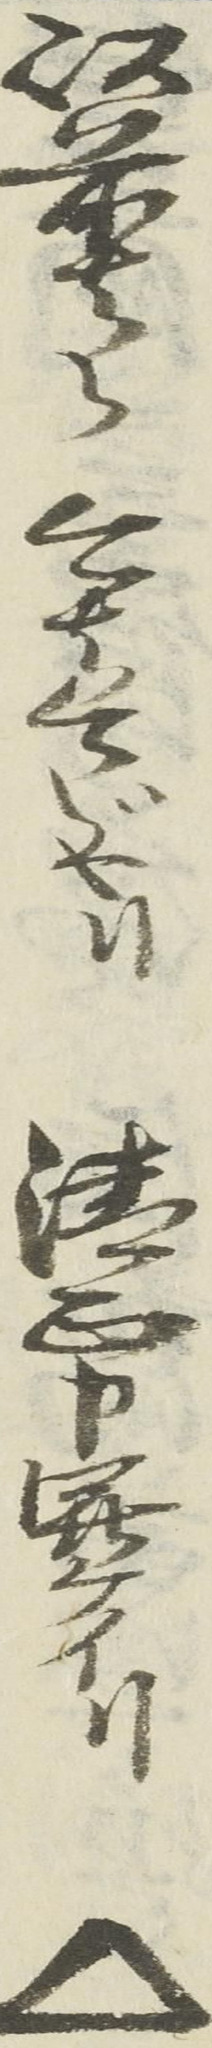以前は今は今じゃり清正申開ケイリ△
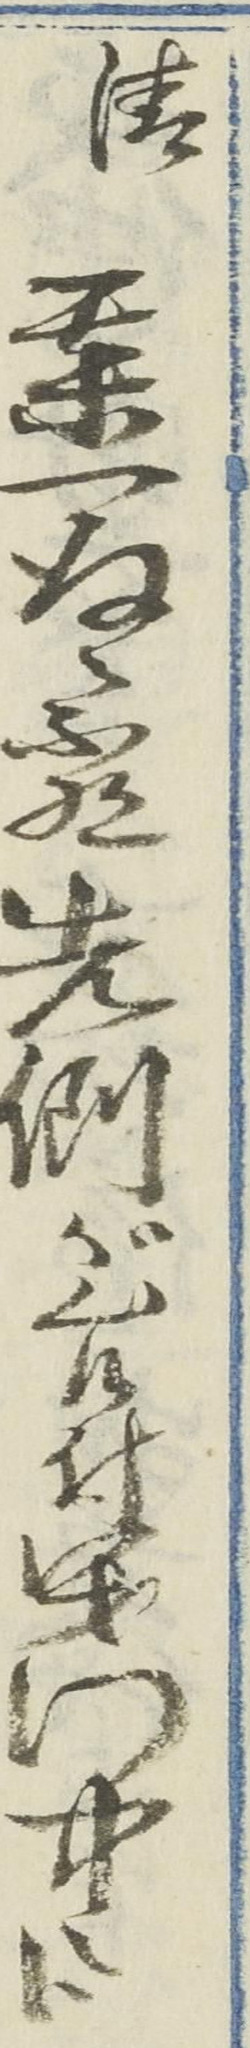清某一存ニ不有先例ガ候付閉門中ニト
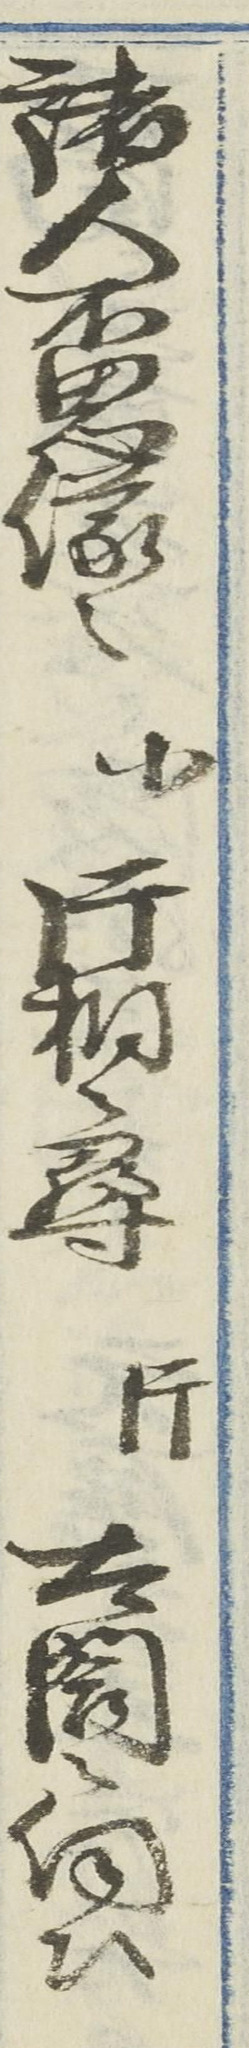諸人不思議也小片桐之尋片太閤ニ向ひ
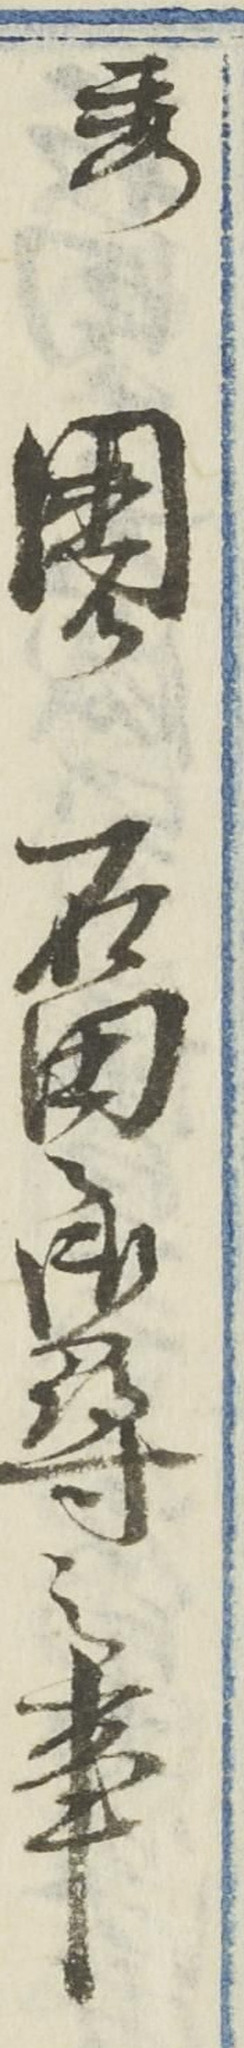秀困ル石田ニ御尋之事
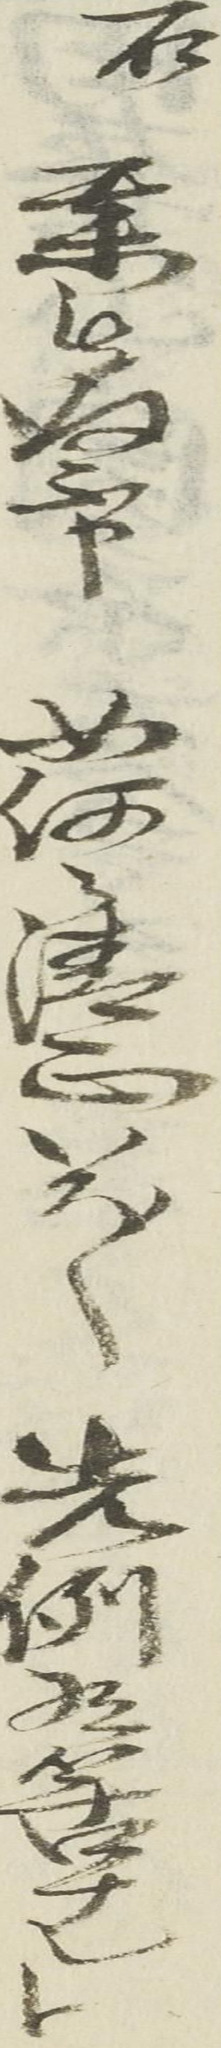石某も存不申如何之清正いろ〳〵先例有之筈ナシト
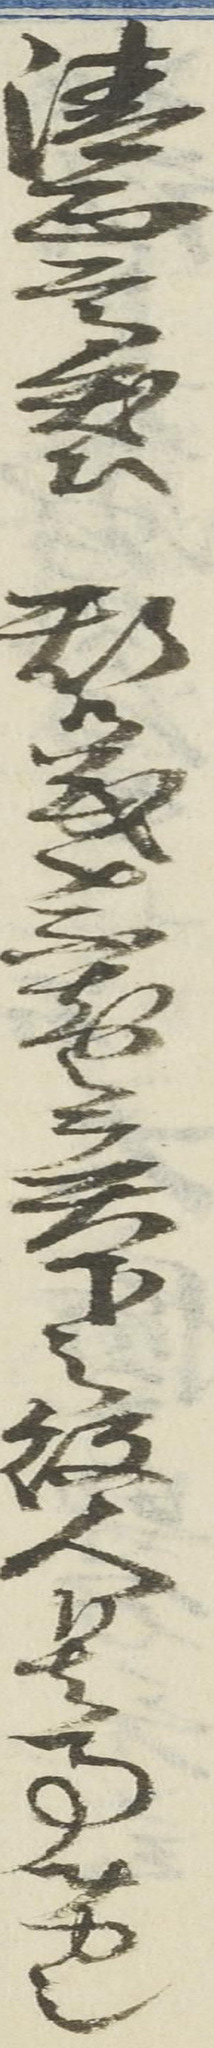清正高笑ひ斯ル義ヲ不知シテ天下の役人トは事ヲカシ
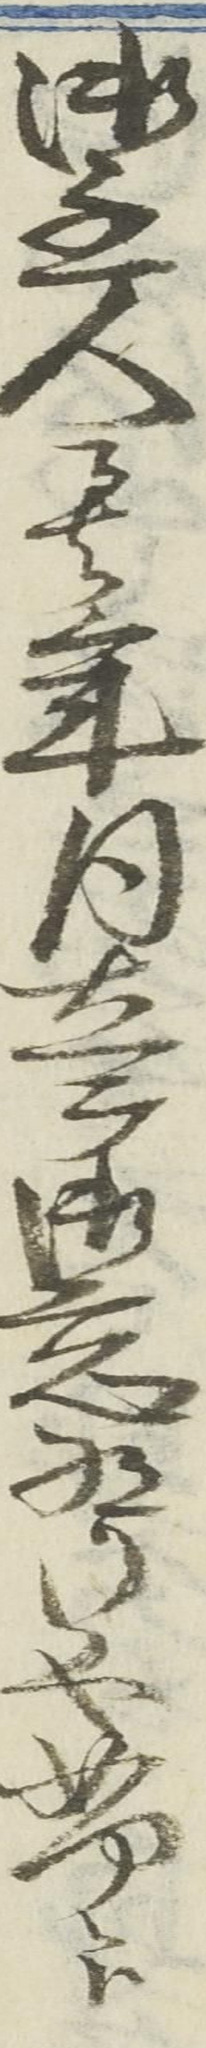御主人ニは年月立テ御忘有りしゃ如何ニト
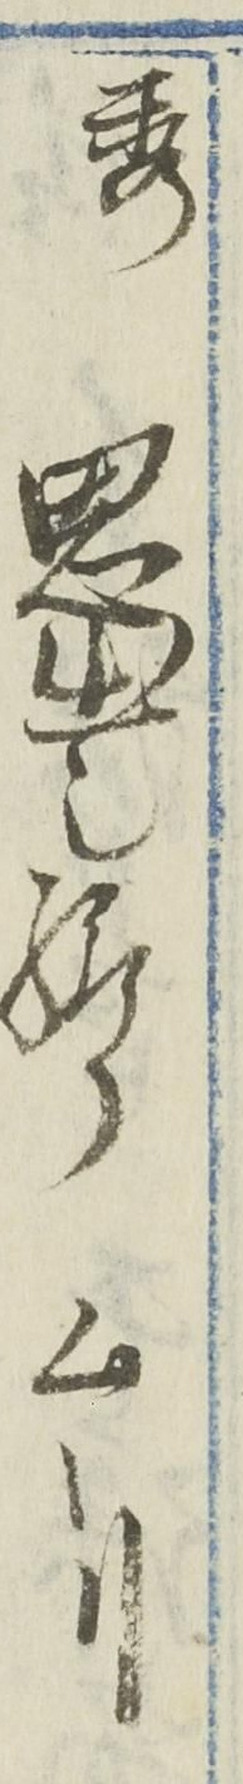秀思出し給うムーリ
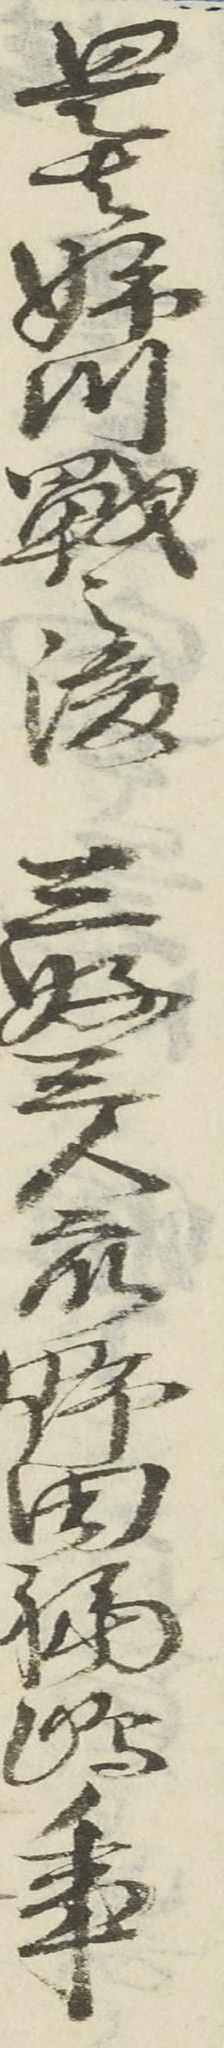是は姉川戦之後三好三人衆野田福嶋ノ事
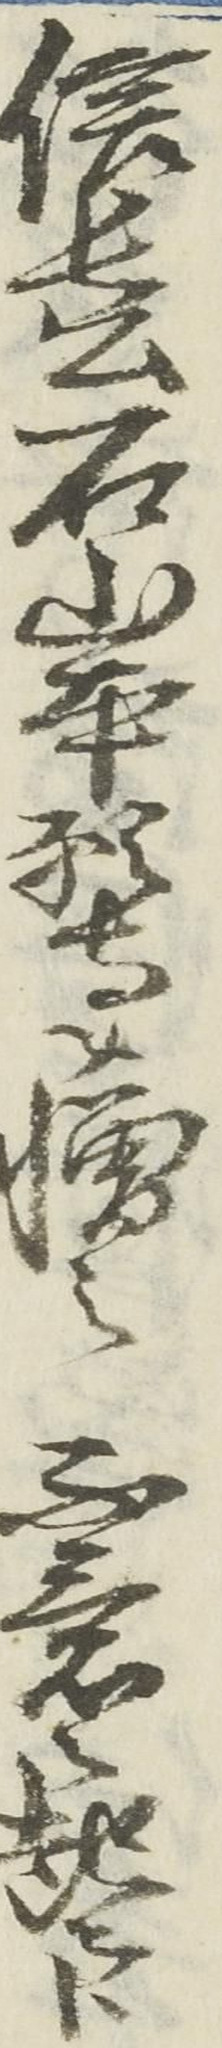信長公石山本願寺ヲ憎ミ不意ニ起テハ
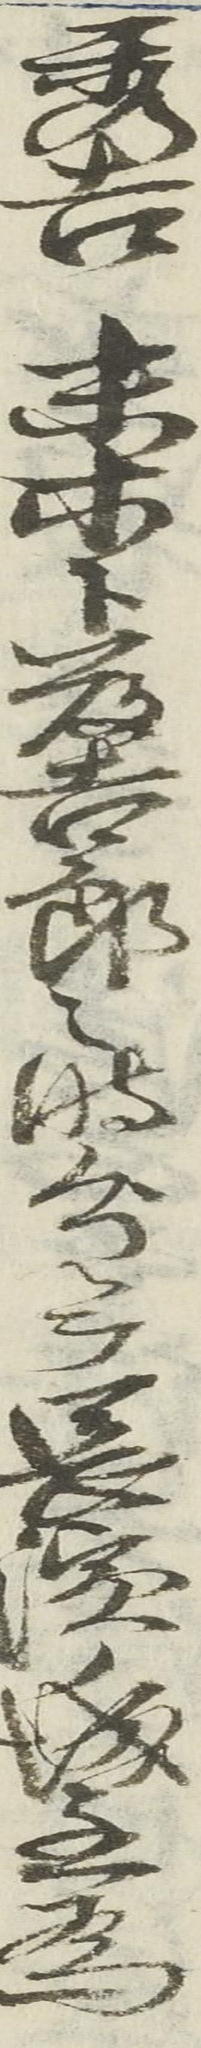秀吉末木下藤吉郎之時分ニテ長浜城主為
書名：伏水大地震
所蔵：東京大学地震研究所図書室 Earthquake Research Institute Library, The University of Tokyo, JAPAN
